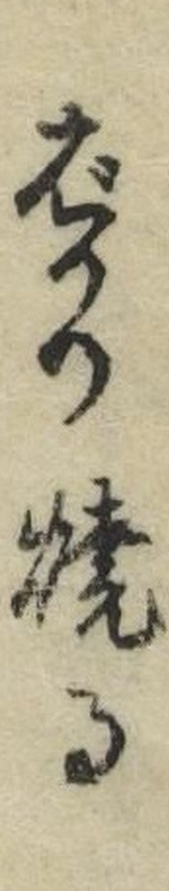ばかり焼る
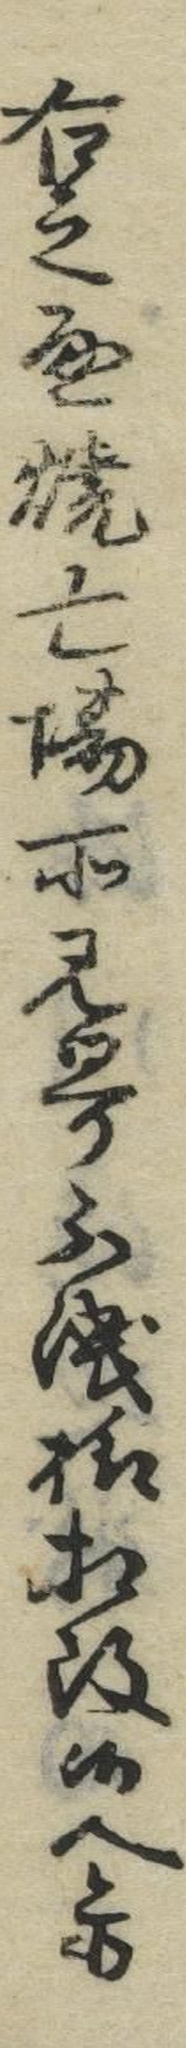右の通焼亡場所見廻り不残様相改候へとも
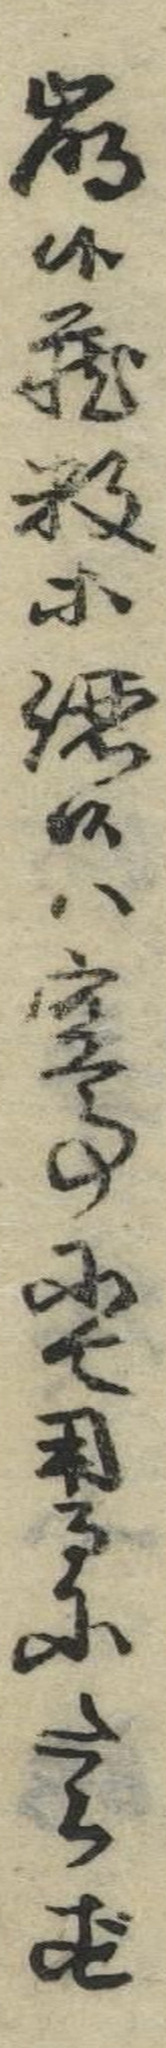崩候蔵数等認候ハ空事にて用るにたらず
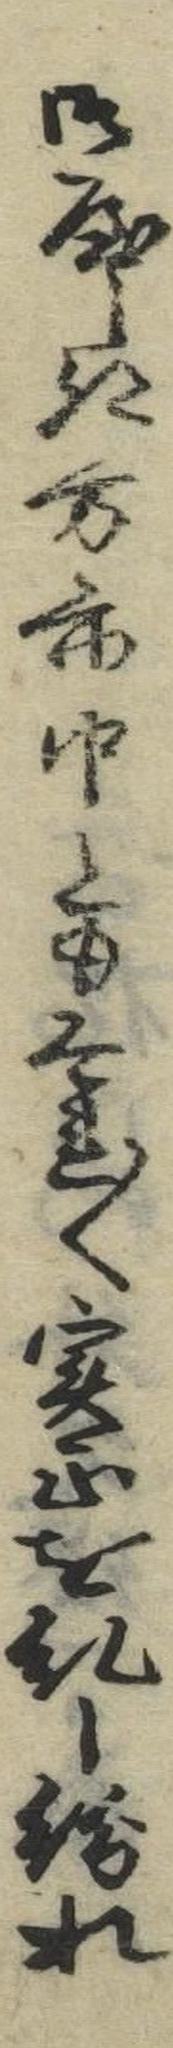御やしき方市中ともそれ〳〵実正を糺し紛れ
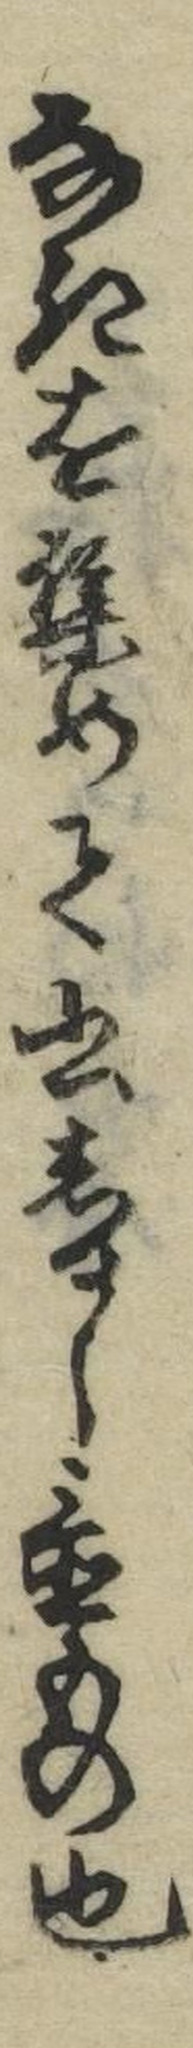なきを集めて書しるし置もの也

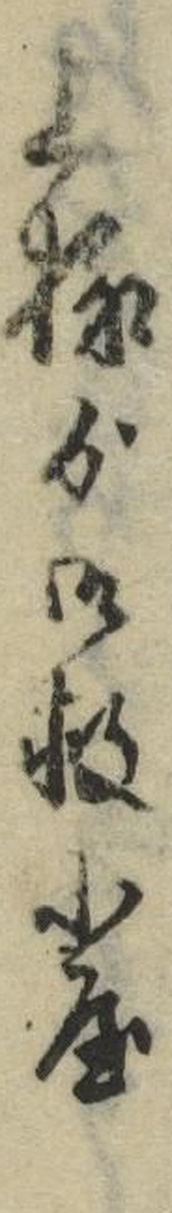上様ゟ御救小屋
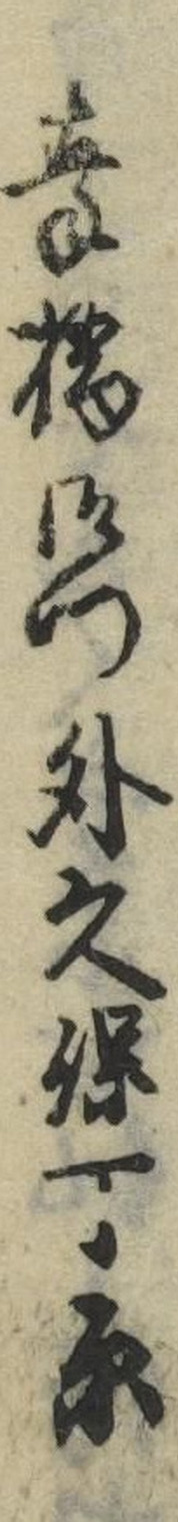幸橋御門外久保丁原
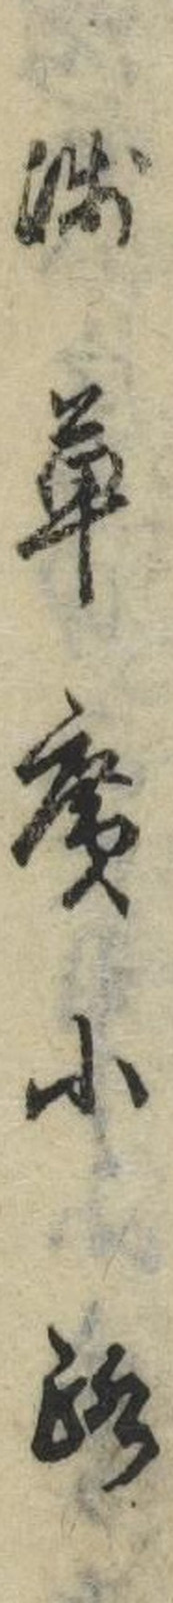浅草広小路
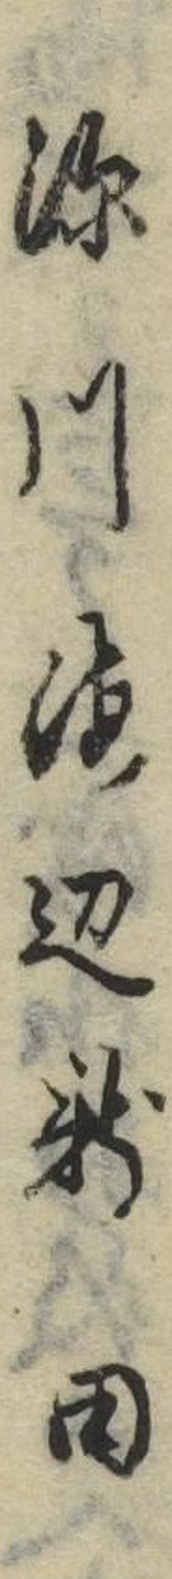深川海辺新田
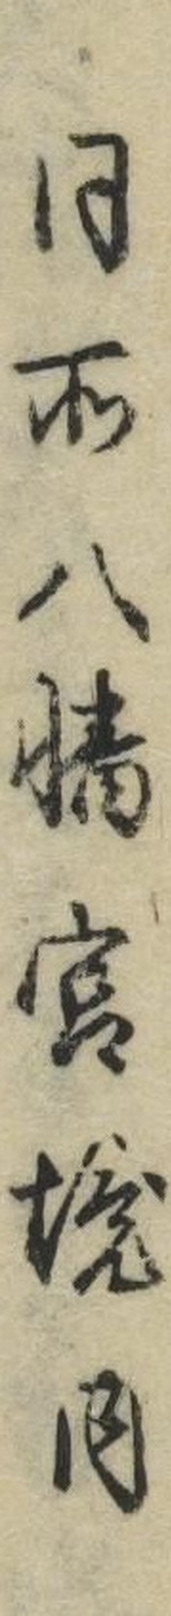同所八幡宮境内
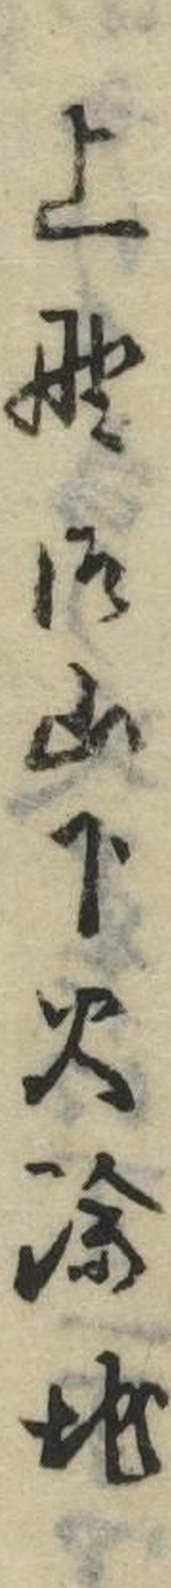上野御山下火除地
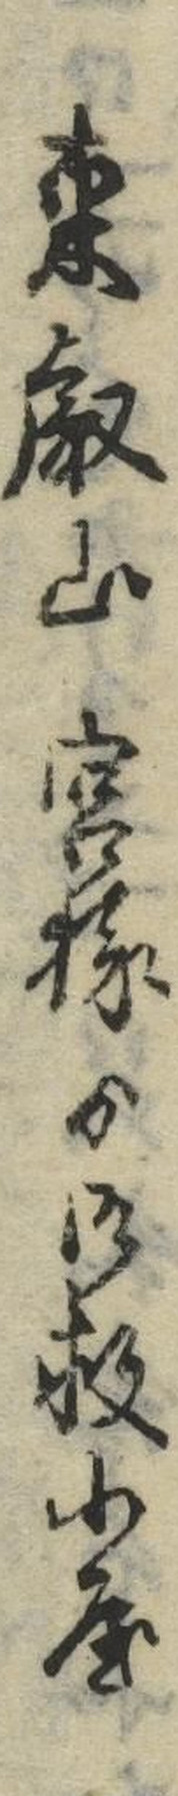東叡山宮様ゟ御救小屋
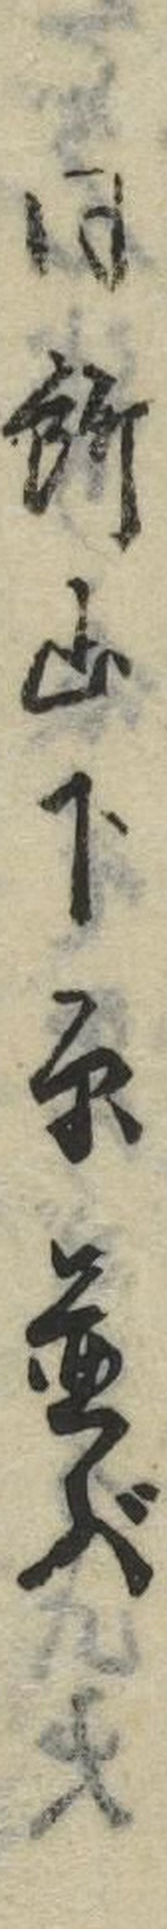同所山下原並ぶ
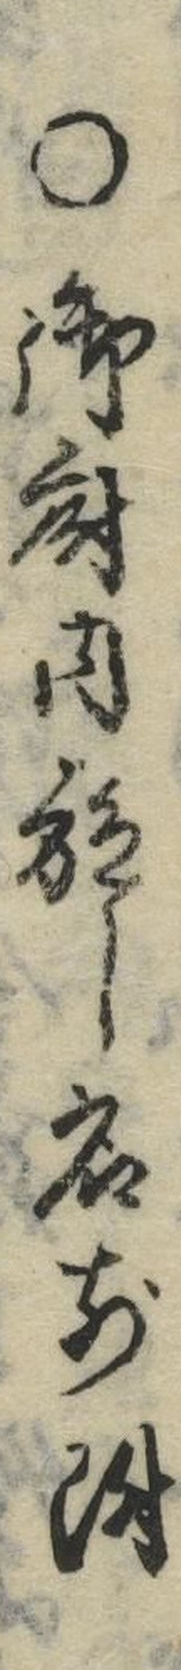◯御府内施し名前附
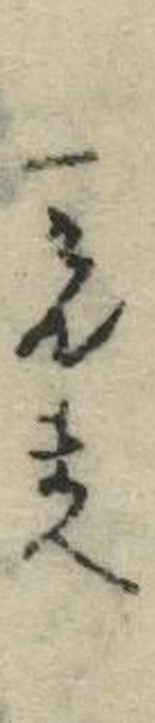一けんまへ
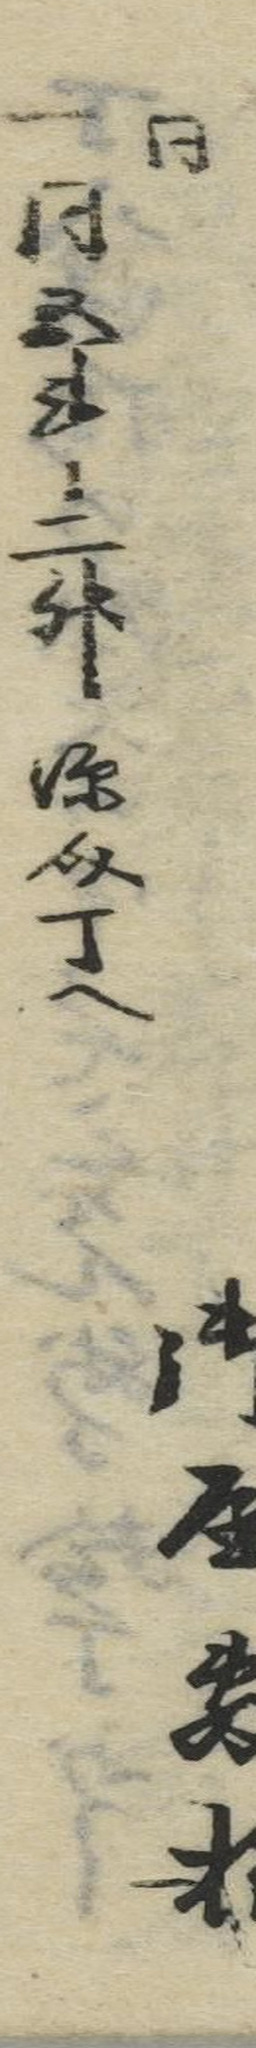一同五斗二升源介丁へ
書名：安政二卯十月二日夜四ツ時過　御府内御屋敷方市中共　地震類焼場所明細書之寫　并街道筋近郷聞書
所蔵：東京大学地震研究所図書室 Earthquake Research Institute Library, The University of Tokyo, JAPAN
